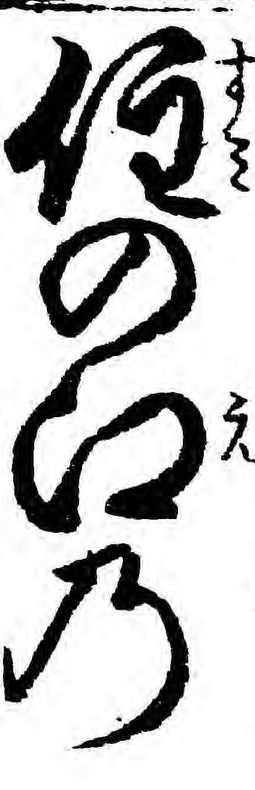住の江の
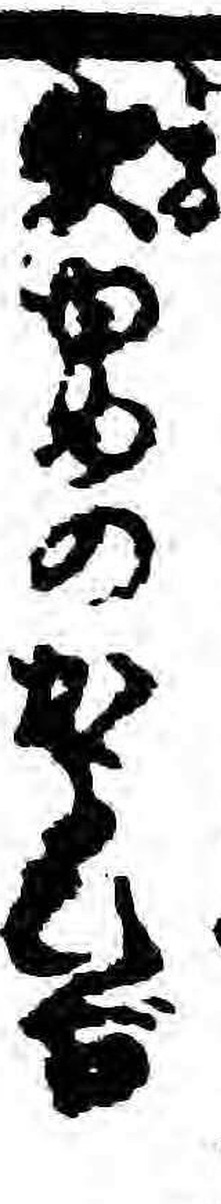夜ゆめのかよひぢ
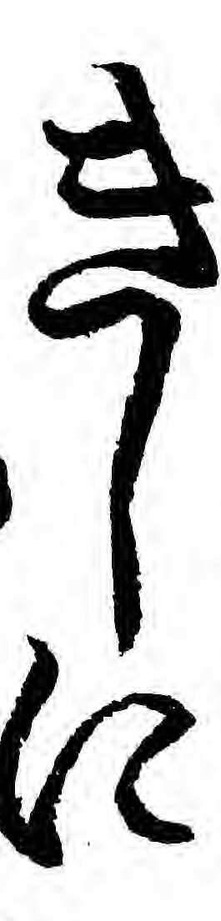きしに
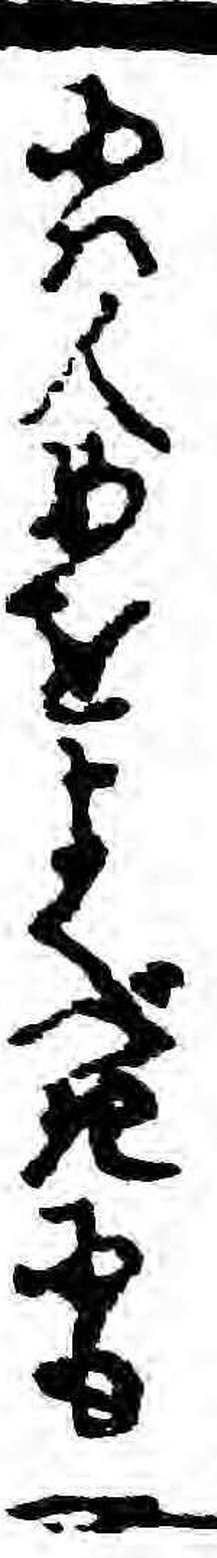には人めをよくべきにも
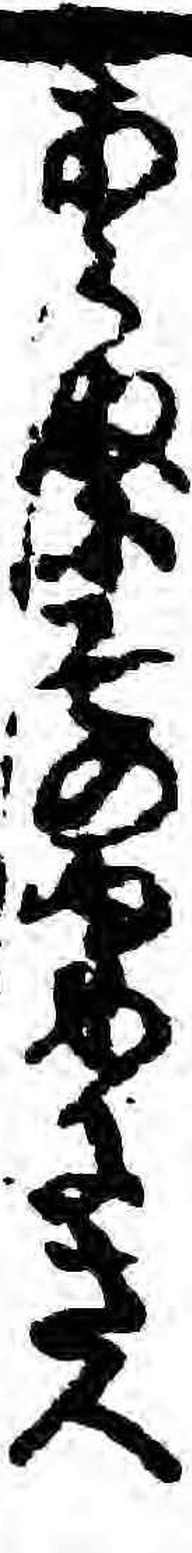あらぬにそのゆめにさへ
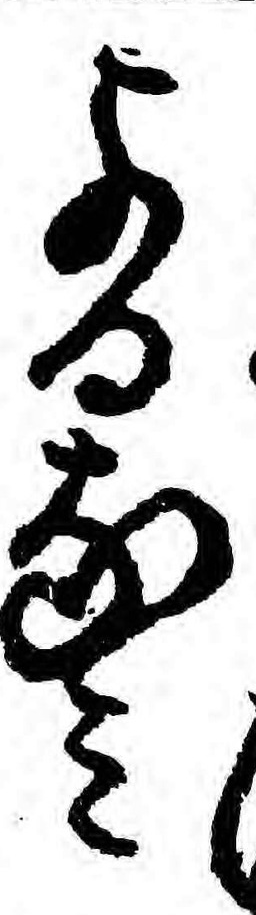よるなみ
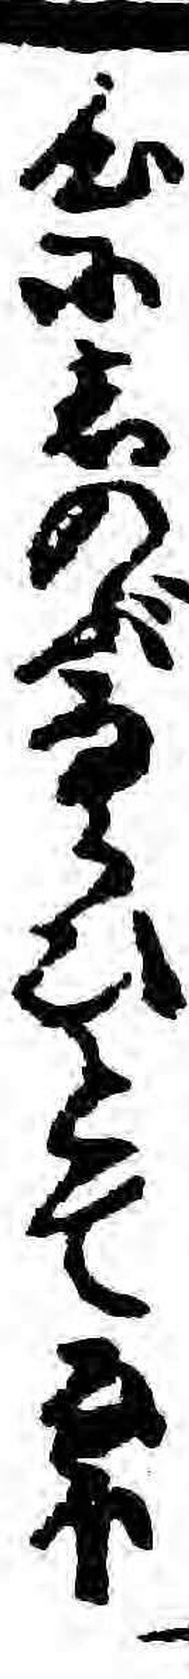心にしのぶならひとてなほ
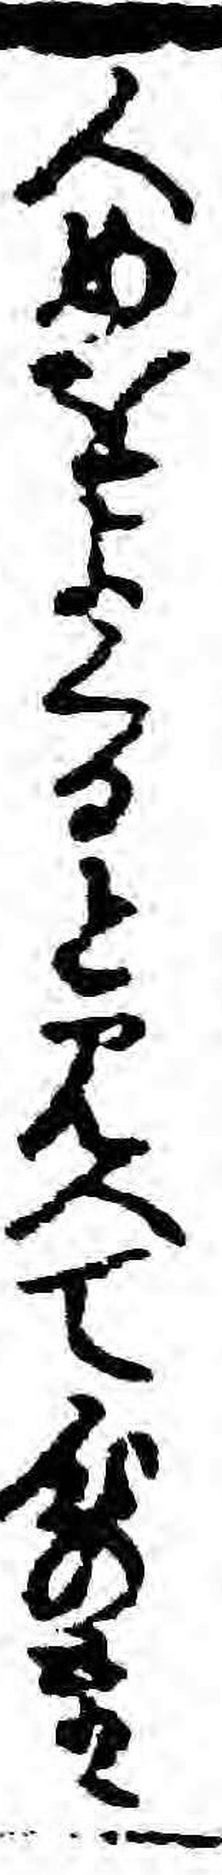人めをよくると見へて心のまゝ
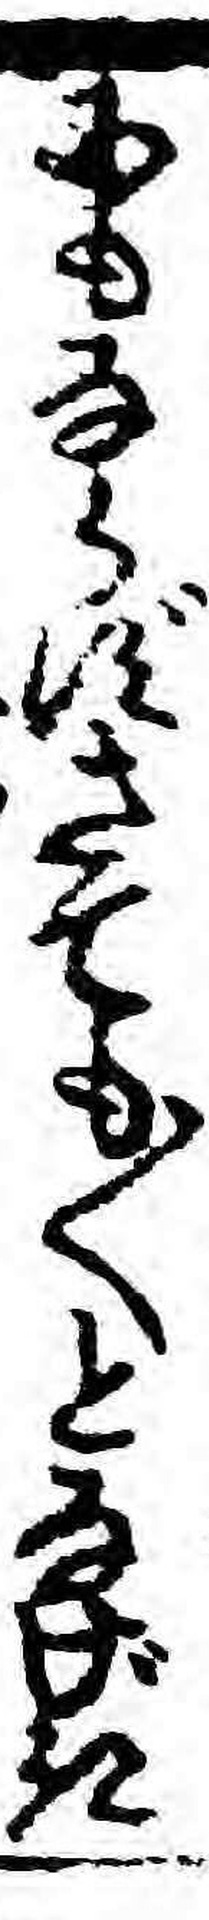にもならずさても〳〵となげき
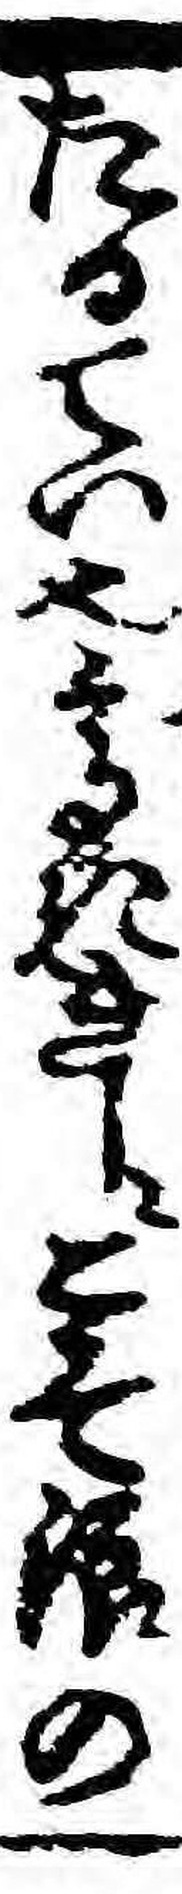たるてい也高ききしにこそ浪の
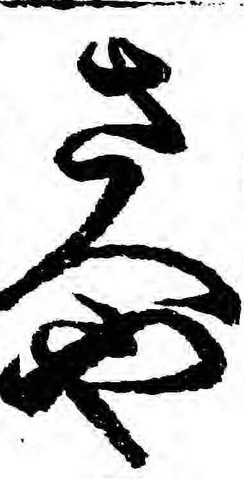さへや
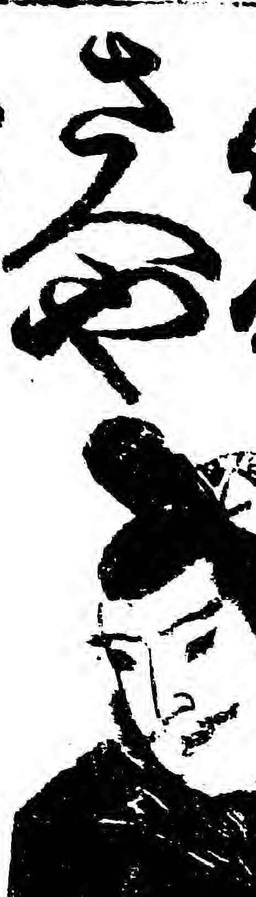さへや
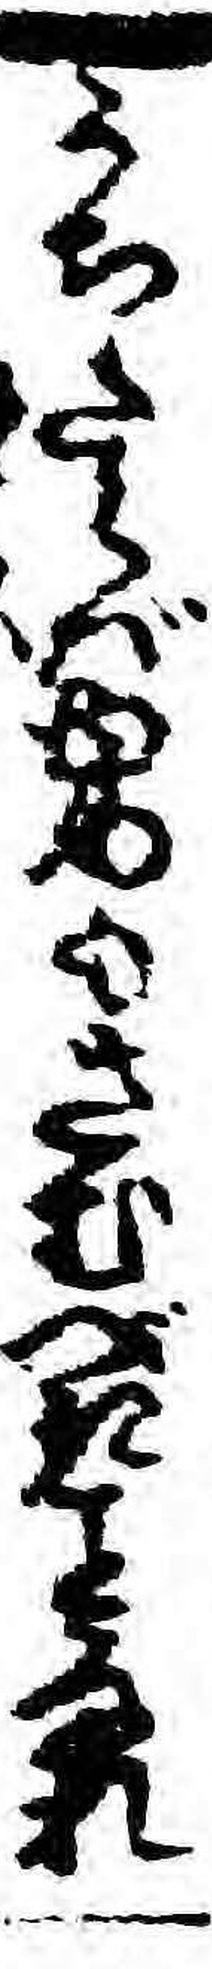うちたらばゆめもさむべきことなれ
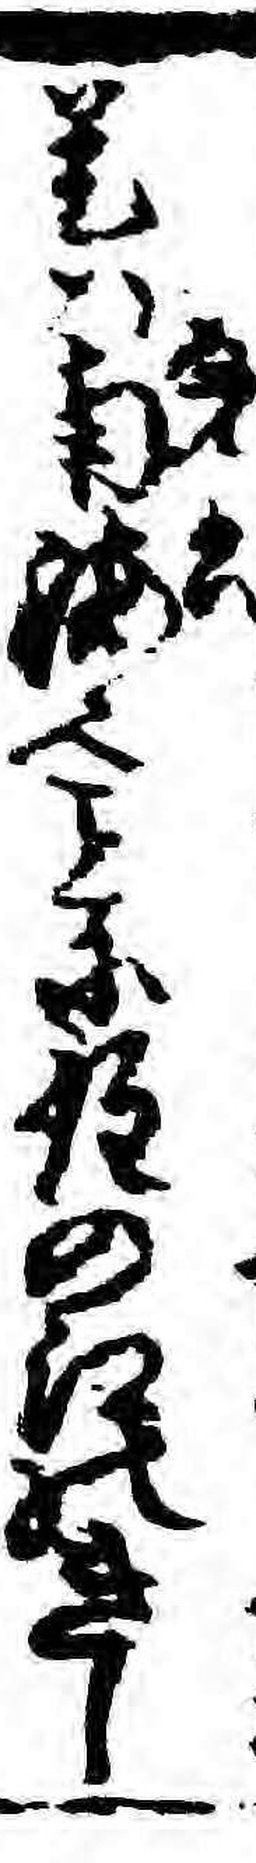是は南海也ことに住の江のきし
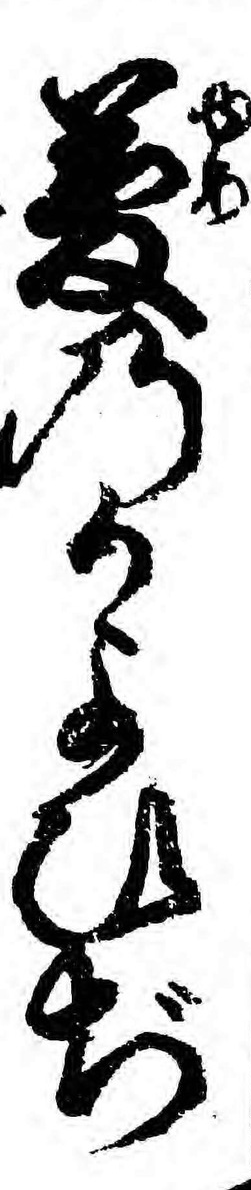夢のかよひぢ
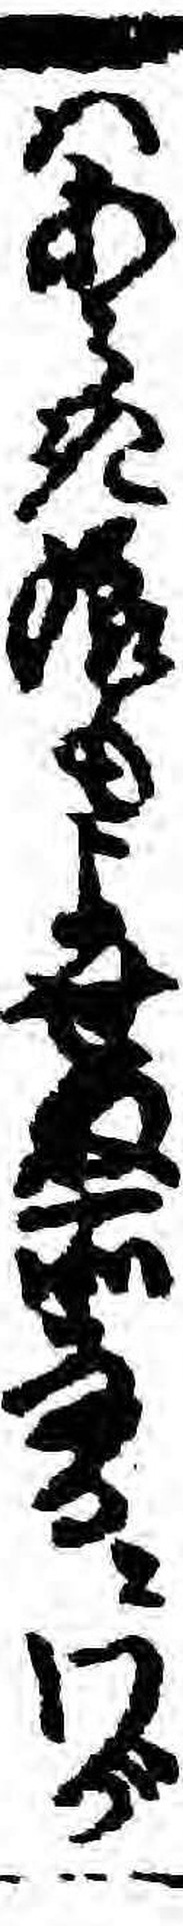はあらき浪もよせぬ所なるにわが
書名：頭書和歌注譯／壽賀多百人一首小倉錦
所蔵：国文学研究資料館
